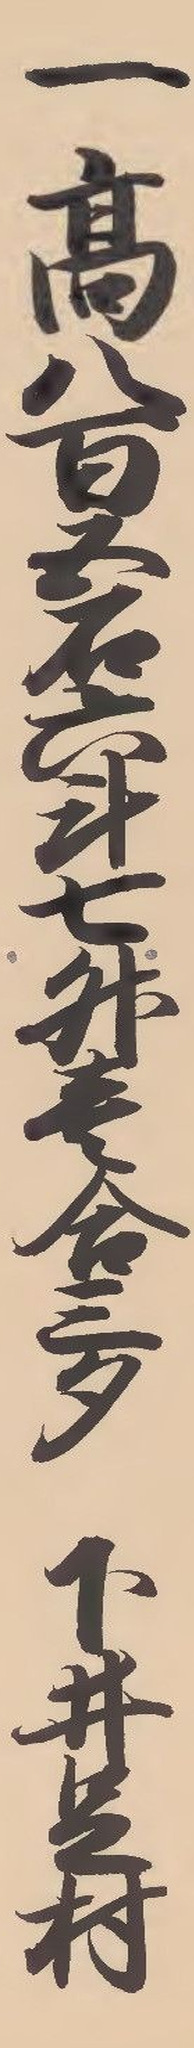一高八百五石六斗七升壱合三勺下井足村
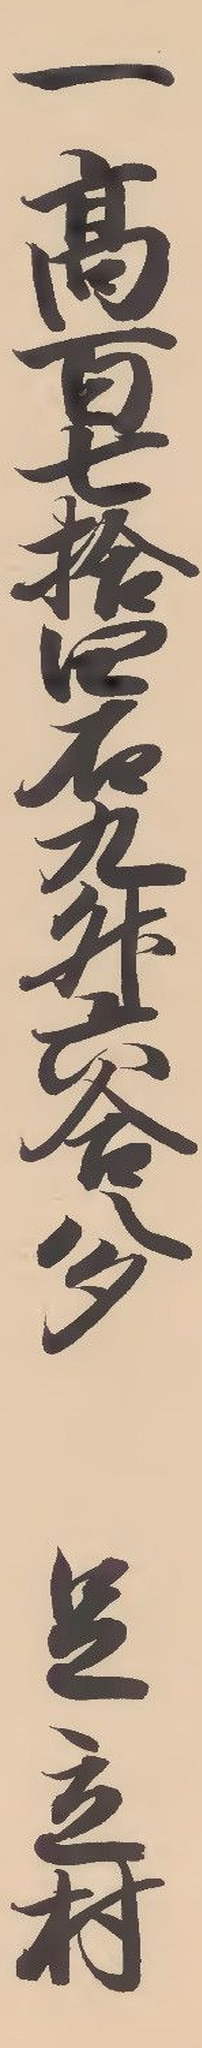一高百七拾四石九升六合八勺足立村
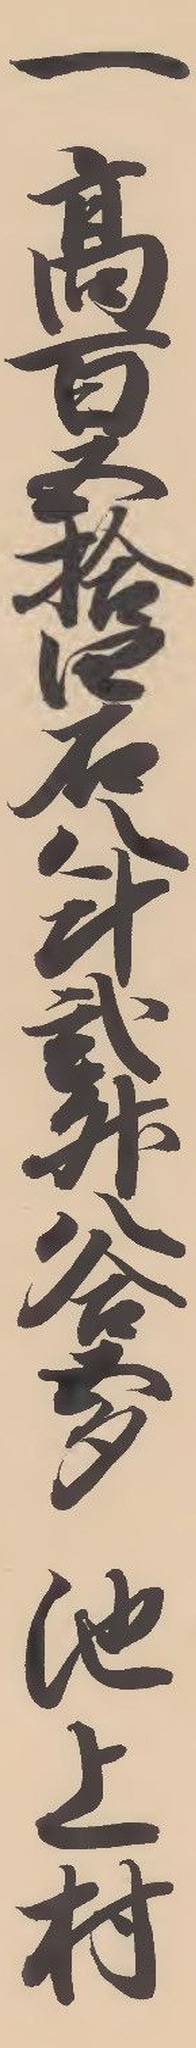一高百五拾四石八斗弐升八合五勺池上村
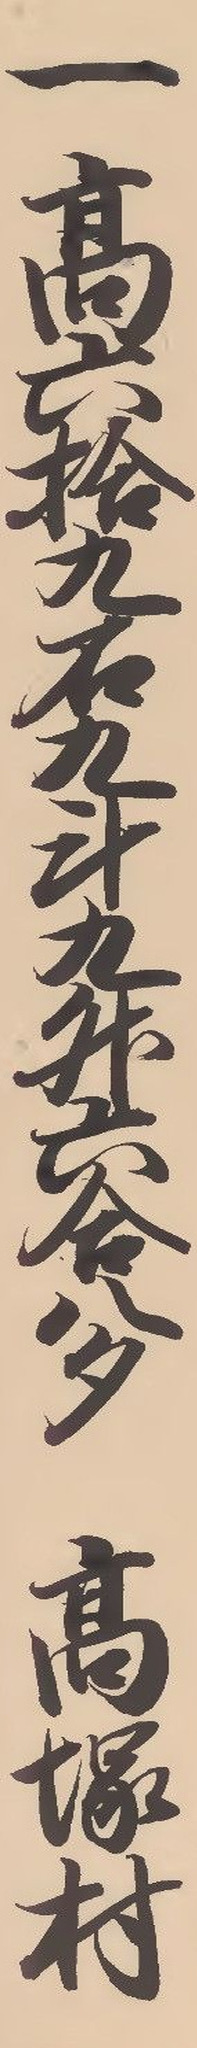一高六拾九石九斗九升六合八勺高塚村
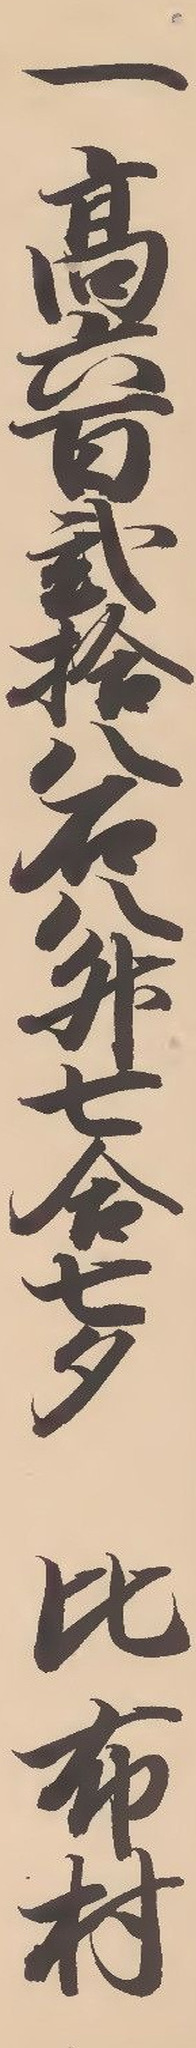一高六百弐拾八石八升七合七勺比布村
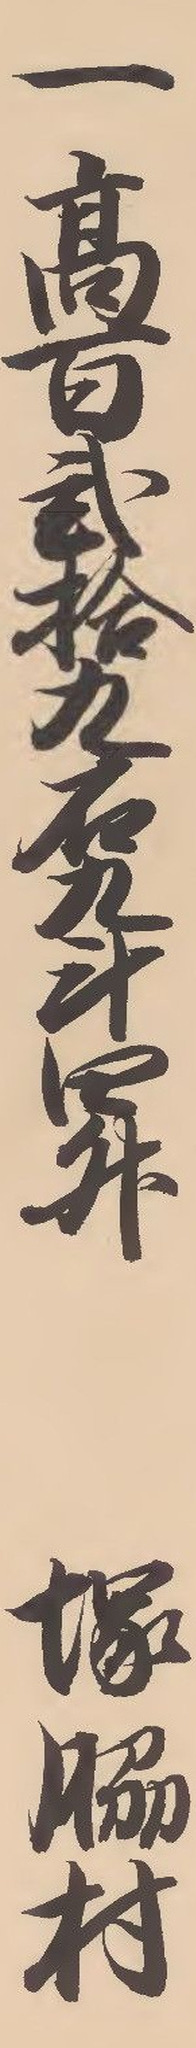一高百弐拾九石九斗四升塚脇村
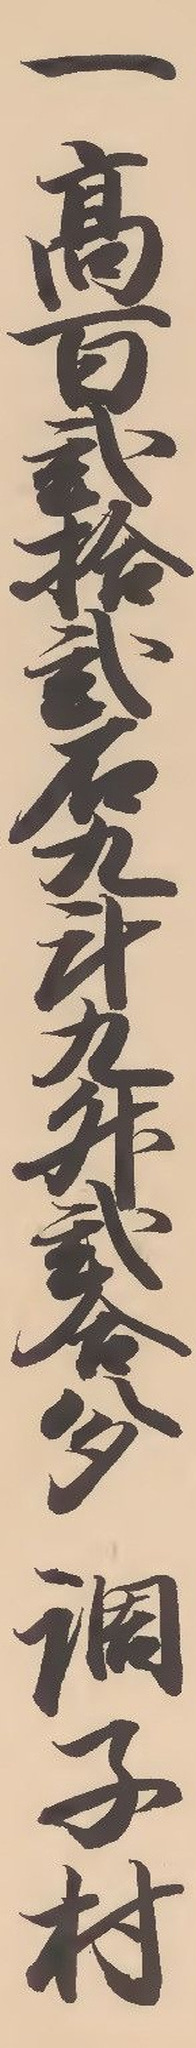一高百弐拾弐石九斗九升弐合八勺調子村
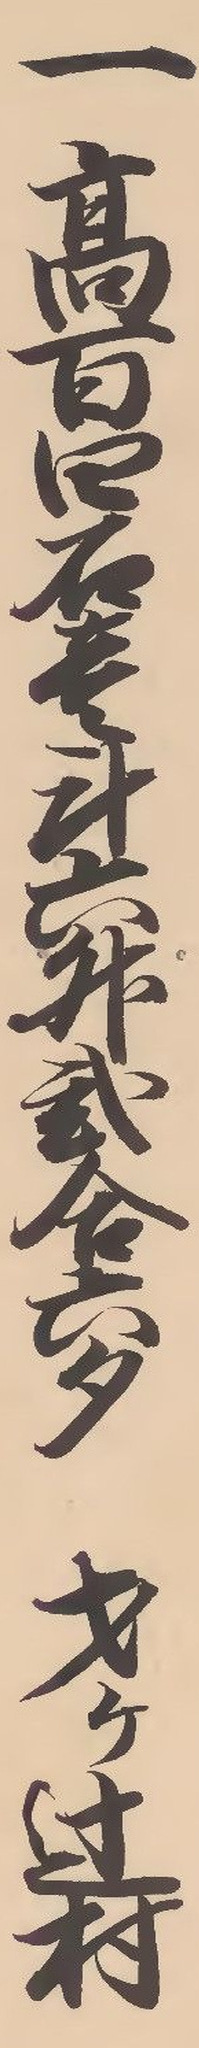一高百四石壱斗六升弐合六勺才ヶ辻村

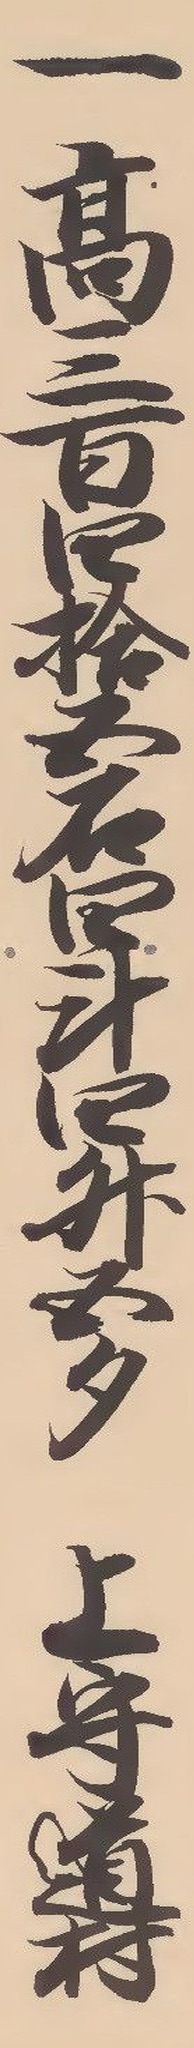一高三百四拾五石四斗四升五勺上守道村
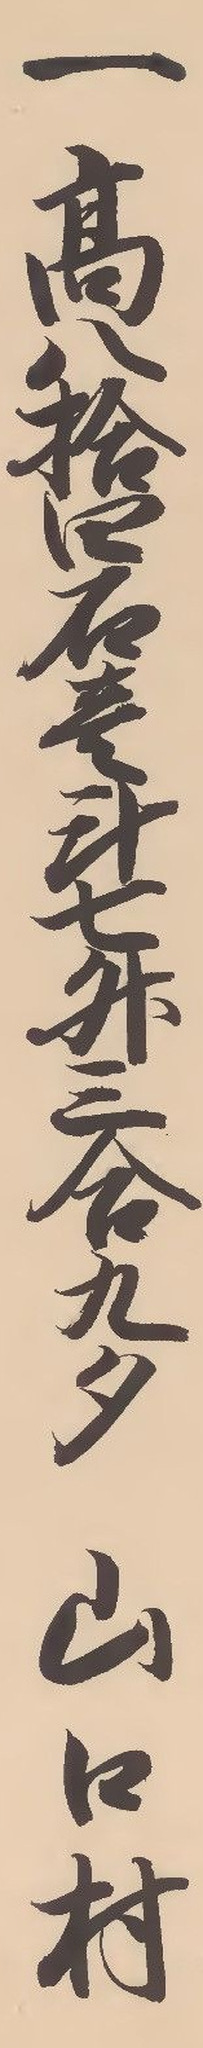一高八拾四石壱斗七升三合九勺山口村
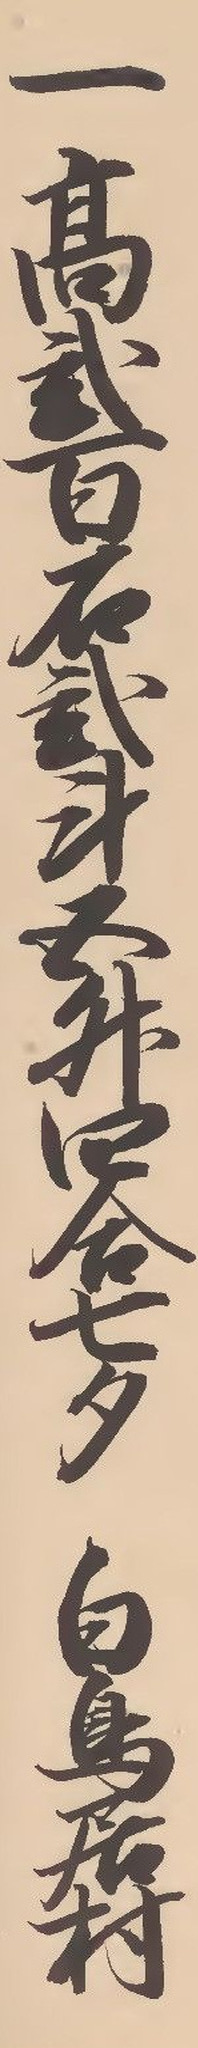一高弐百石弐斗五升四合七勺白鳥居村
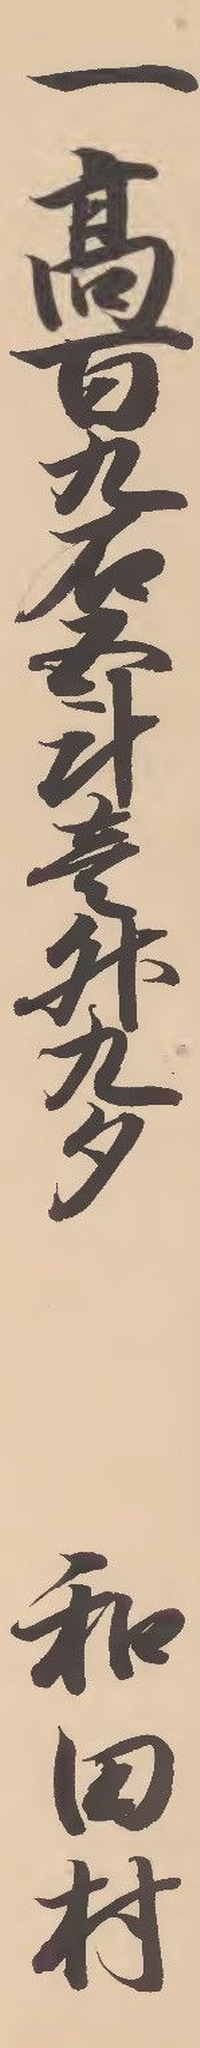一高百九石五斗壱升九勺和田村
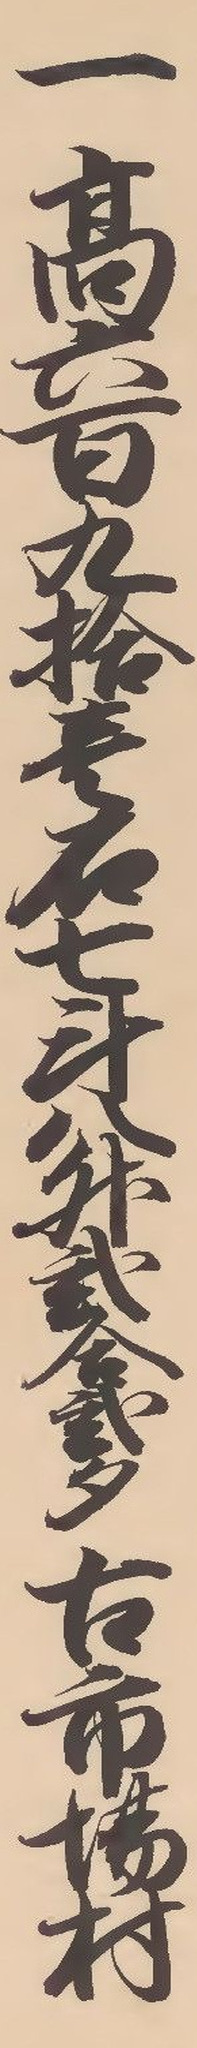一高六百九拾壱石七斗八升弐合弐勺古市場村
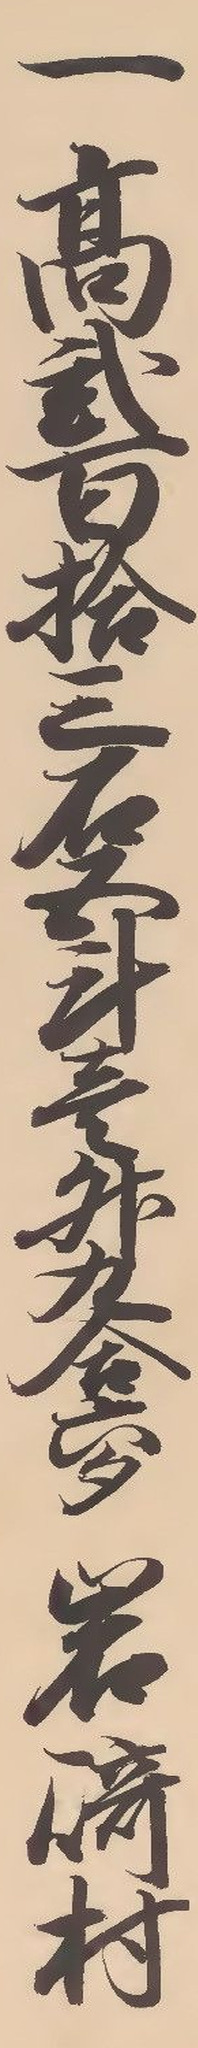一高弐百拾三石五斗壱升九合六勺岩崎村
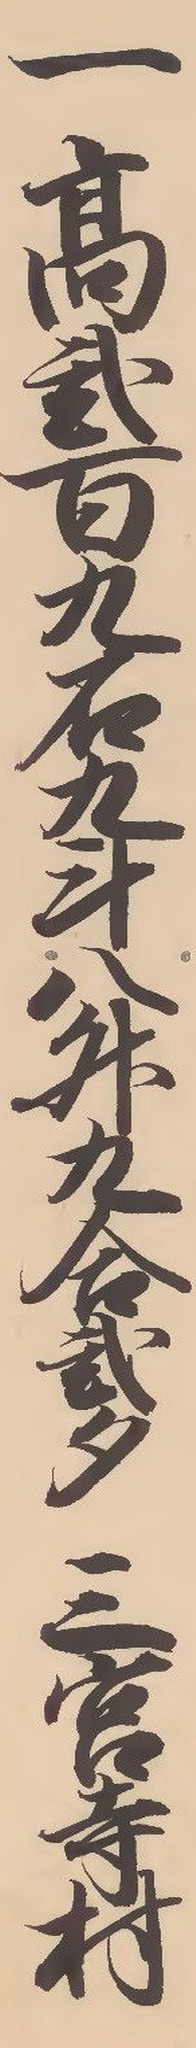一高弐百九石九斗八升九合弐勺三宮寺村

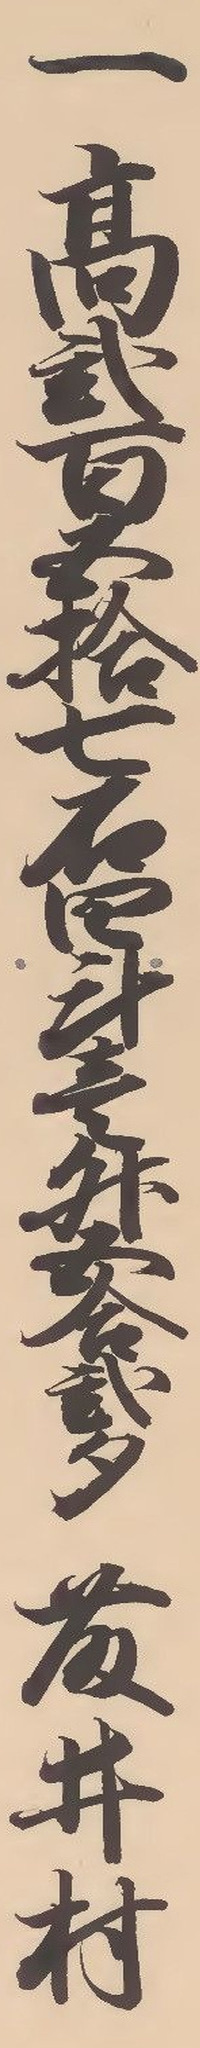一高弐百五拾七石四斗壱升五合弐勺藤井村
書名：大和国郷帳
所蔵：国立公文書館 National Archives of Japan
